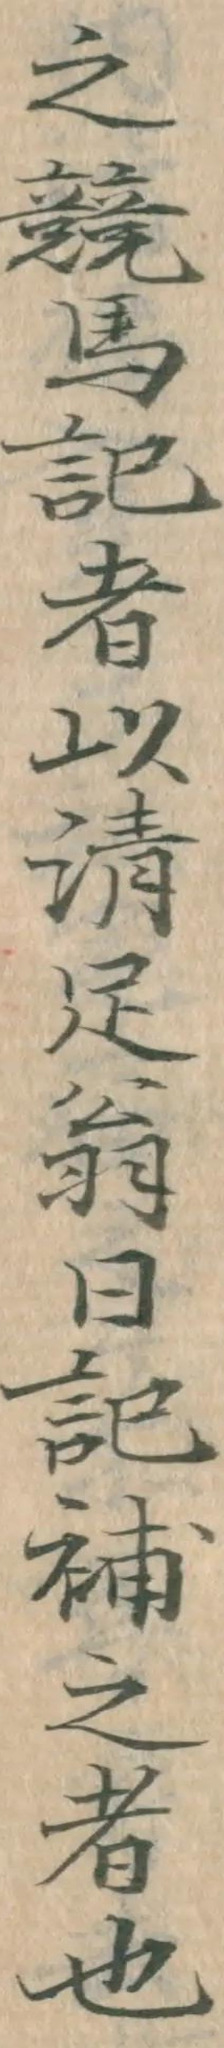之競馬記者以請足翁日記補之者也
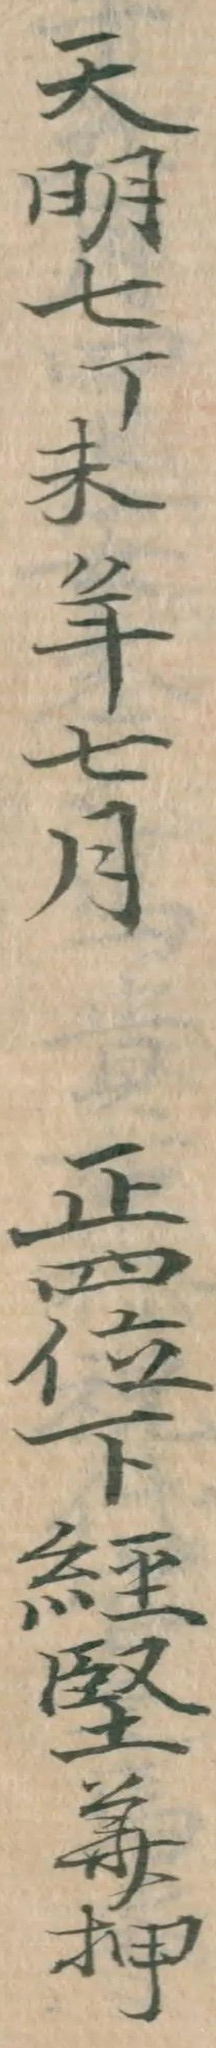天明七丁未年七月正四位下経堅兼押
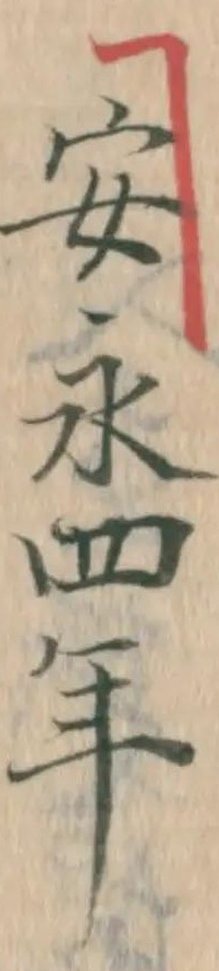安永四年
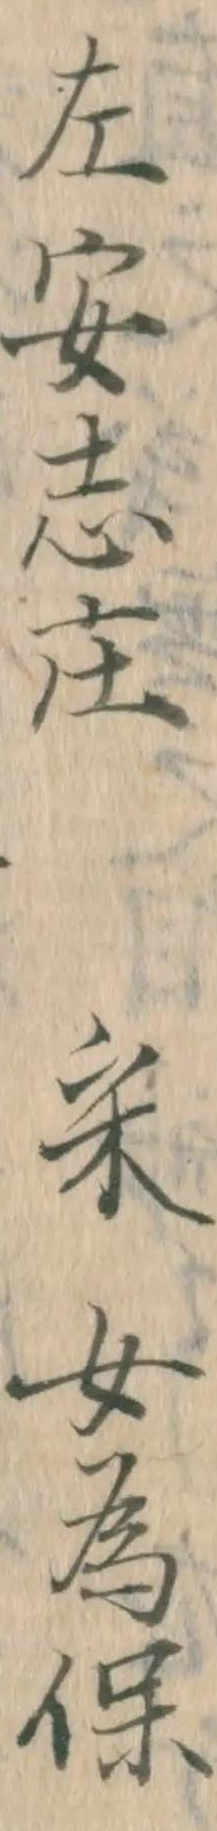左安志庄采女為保
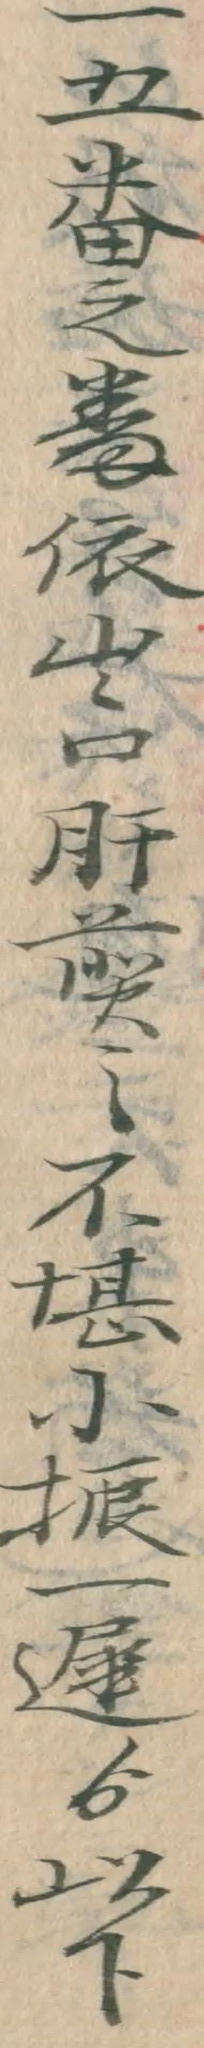一五番之番依出口肝煎之不堪小振一遅ゟ以下
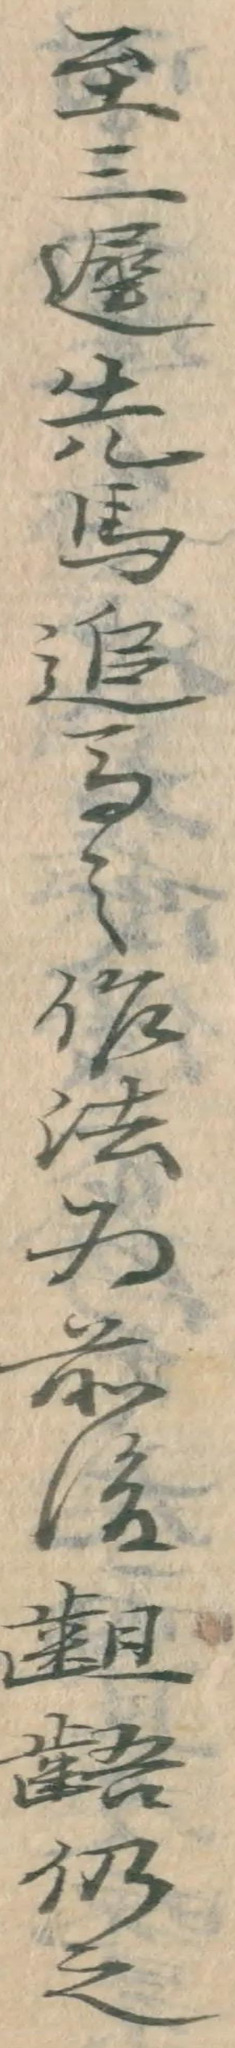至三遅先馬追馬之作法為前後齟齬仍之
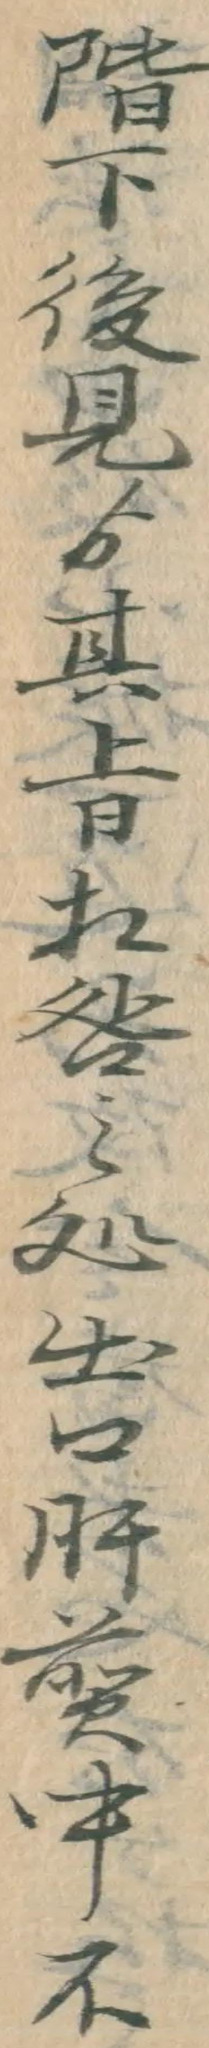階下後見ゟ其旨相咎之処出口肝煎中不

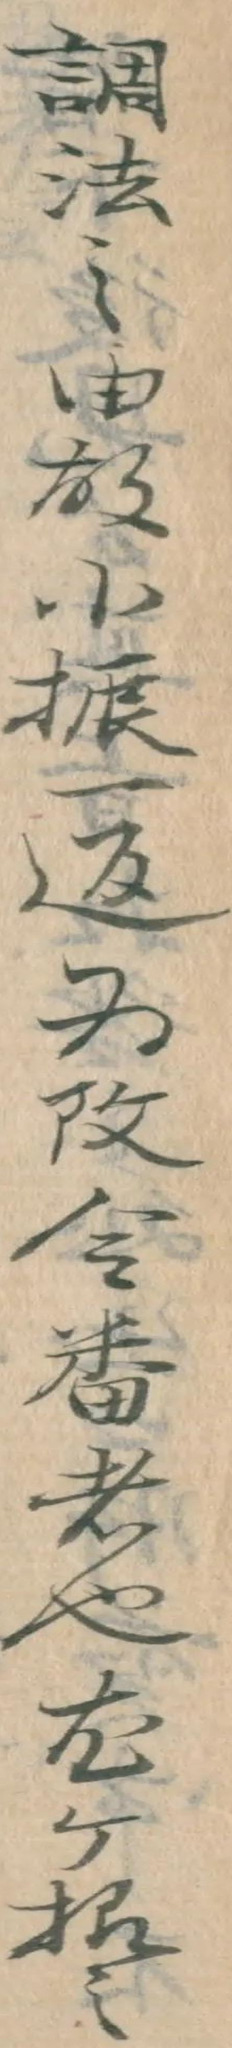調法之由故小振一返為改令番者也尤ケ様之
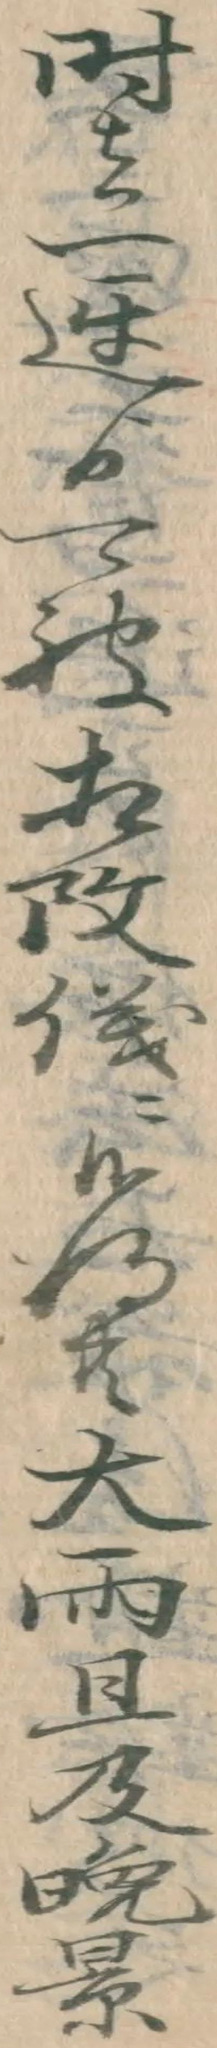時者一遅ゟ可被相改儀ニ候得共大雨且及晩景
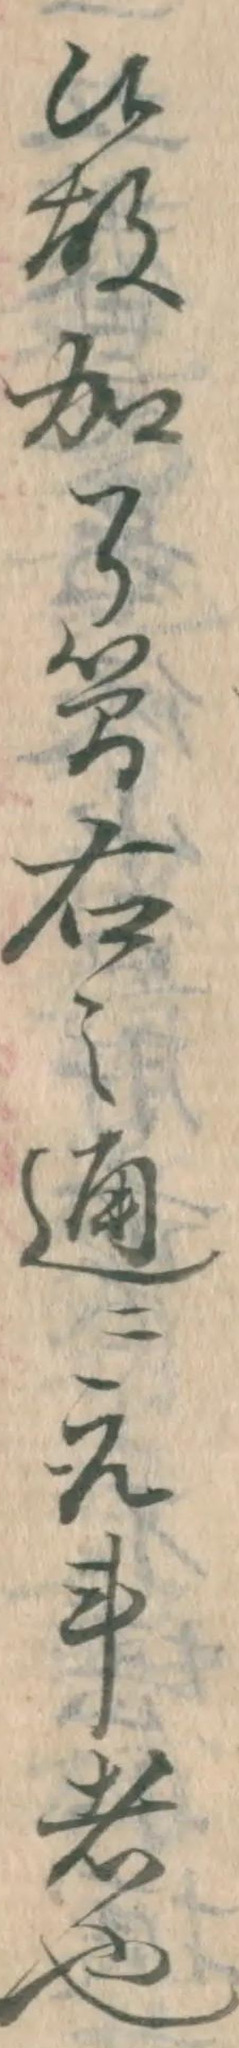候故加了簡右之通ニ取計者也
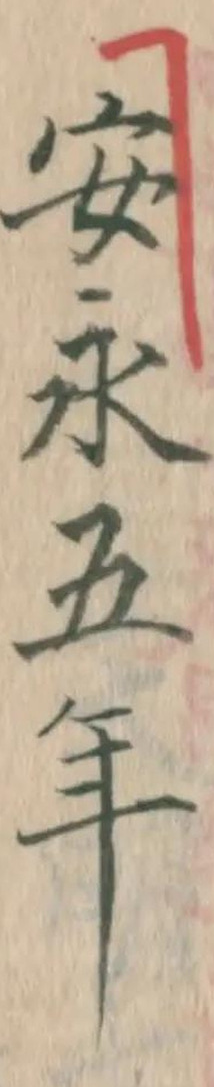安永五年
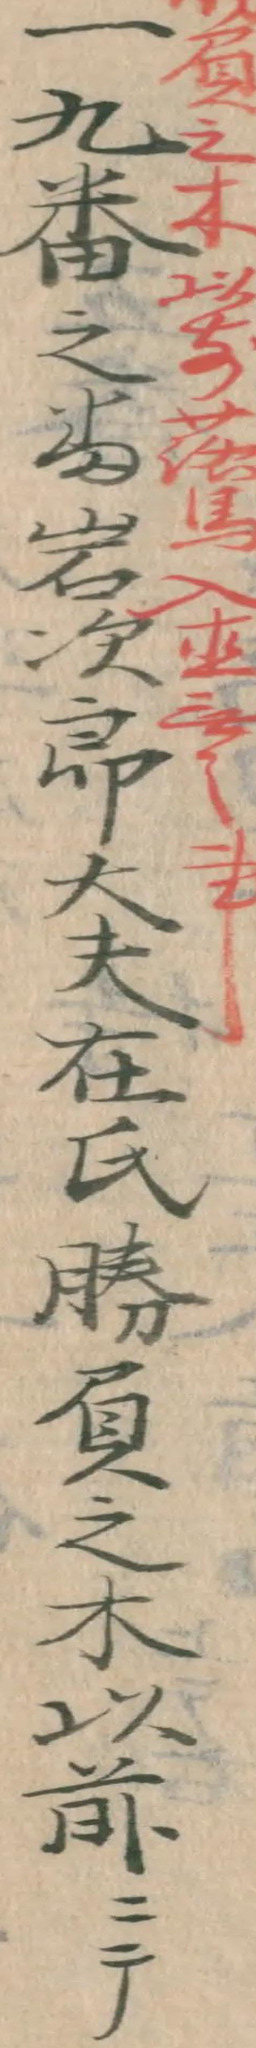一九番之番岩次郎大夫在氏勝負之木以前ニテ
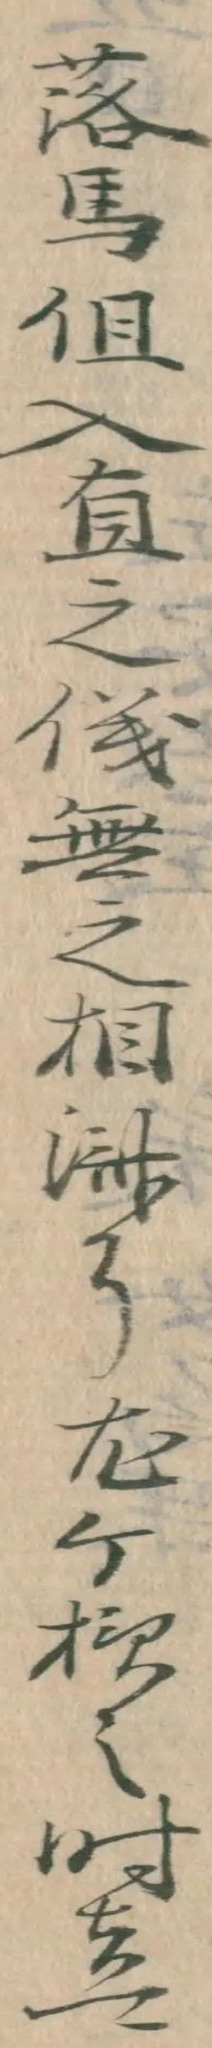落馬但入直之儀無之相済了尤ケ様之時者可
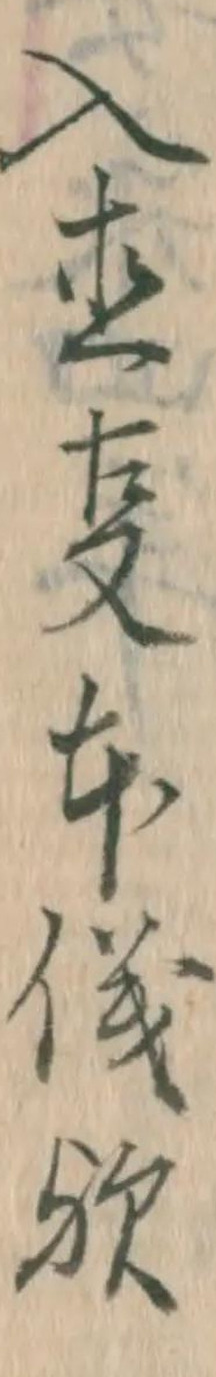入直事本儀歟
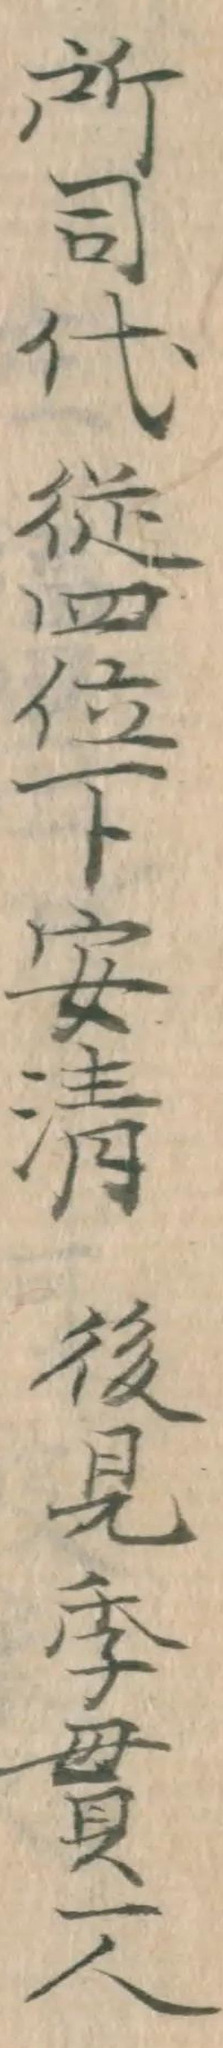所司代従四位下安清後見季貫一人
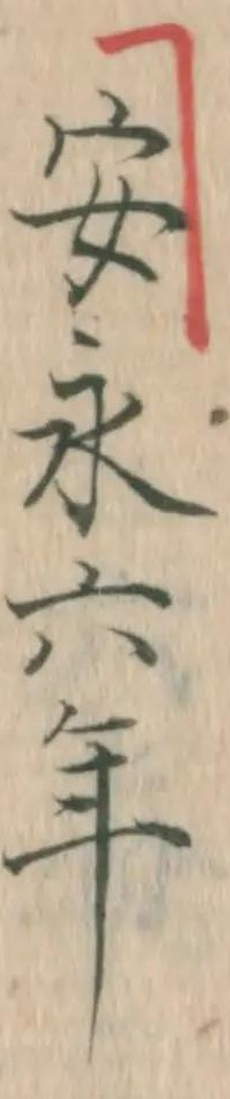安永六年
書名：賀茂社記録. 第10冊
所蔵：国立国会図書館 National Diet Library, JAPAN
